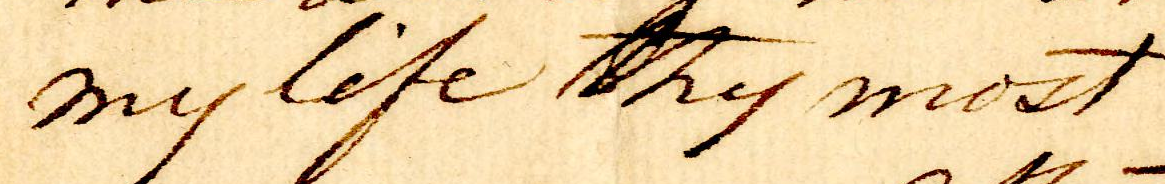my life thy most
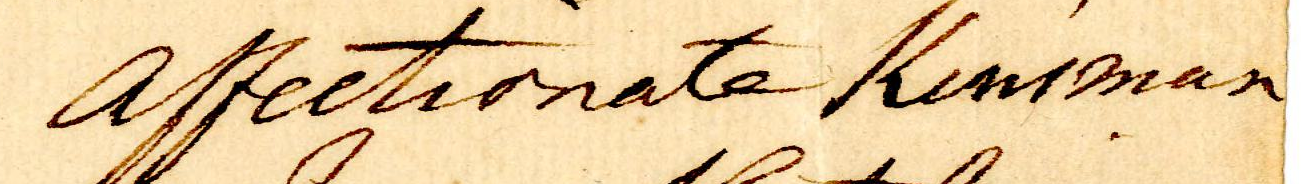Affectionate Kinsman
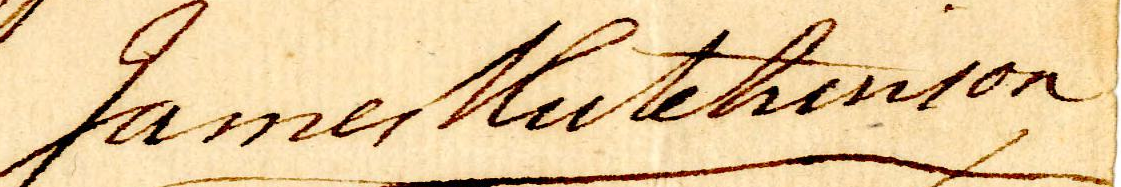James Hutchinson
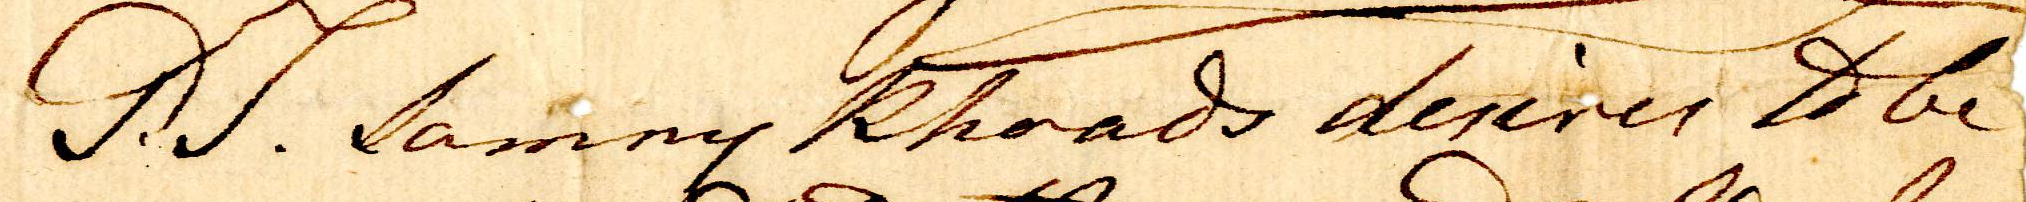P.S. Sammy Rhoads desires to be
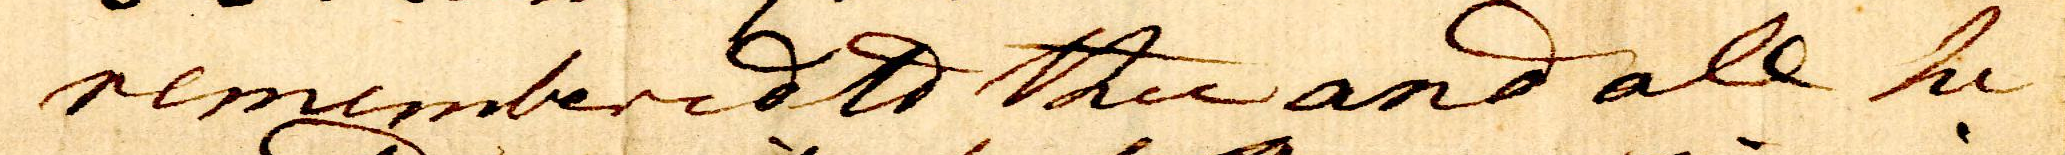remembered to thee and all he
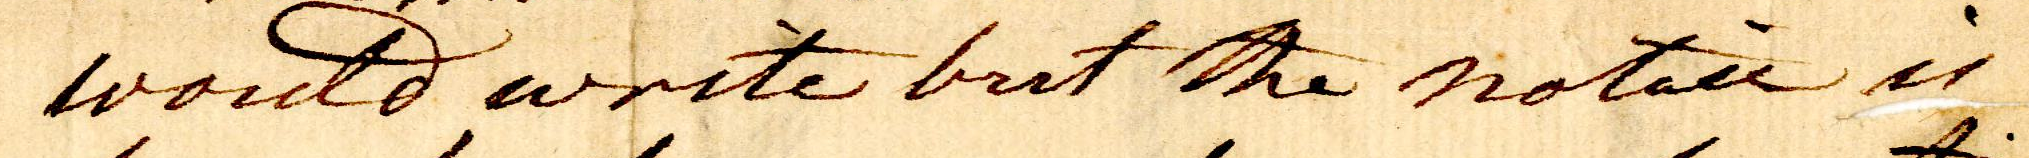would write but the notice is
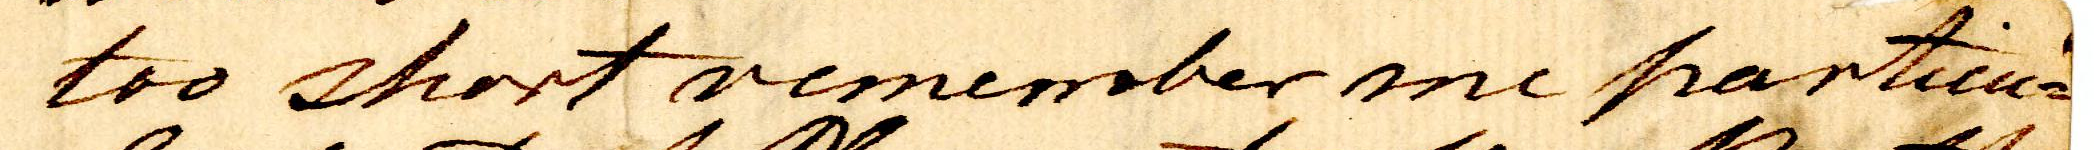too short remember me particu-
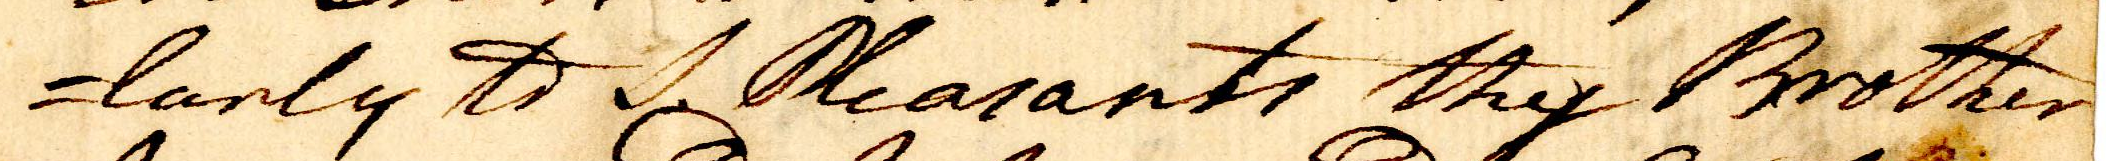-larly to S. Pleasants thy Brother
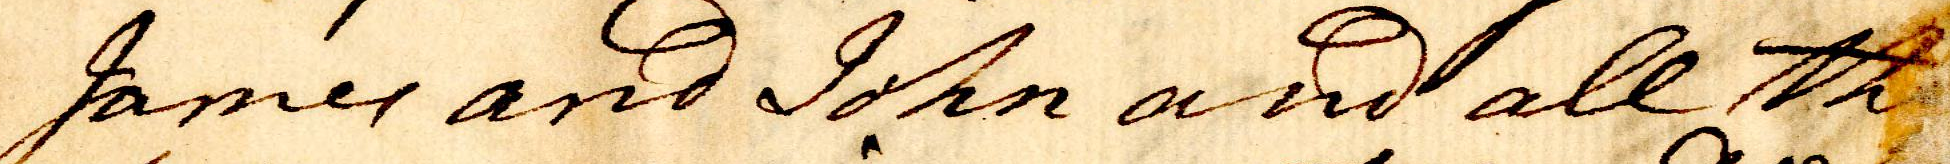James and John and all the
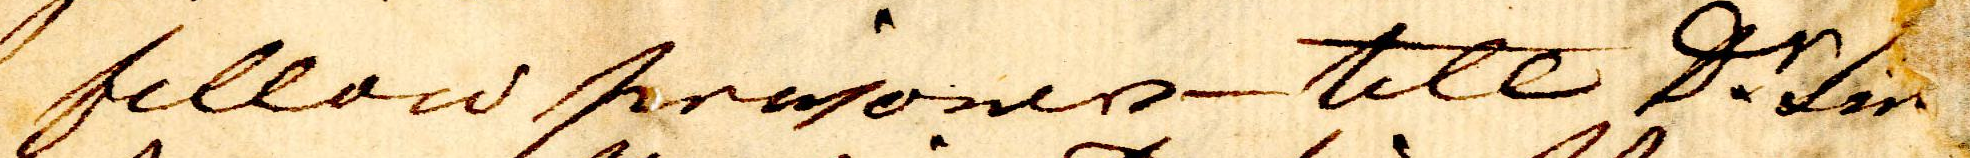fellow prisoners- tell D^r. Lin
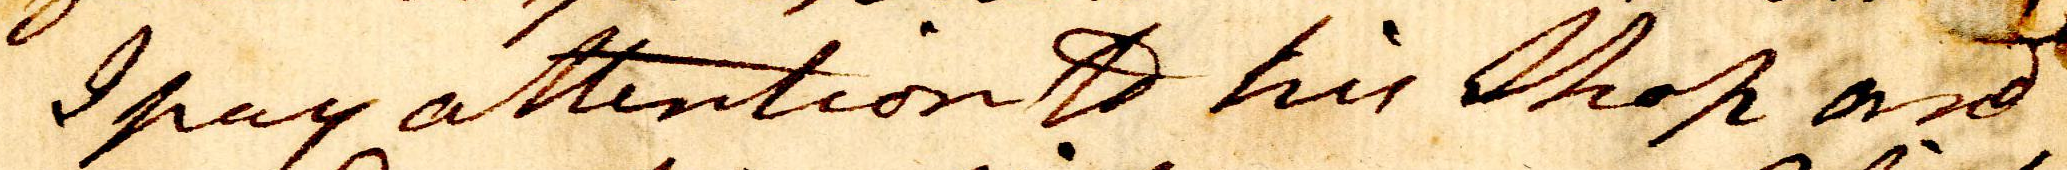I pay attention to his Shop and
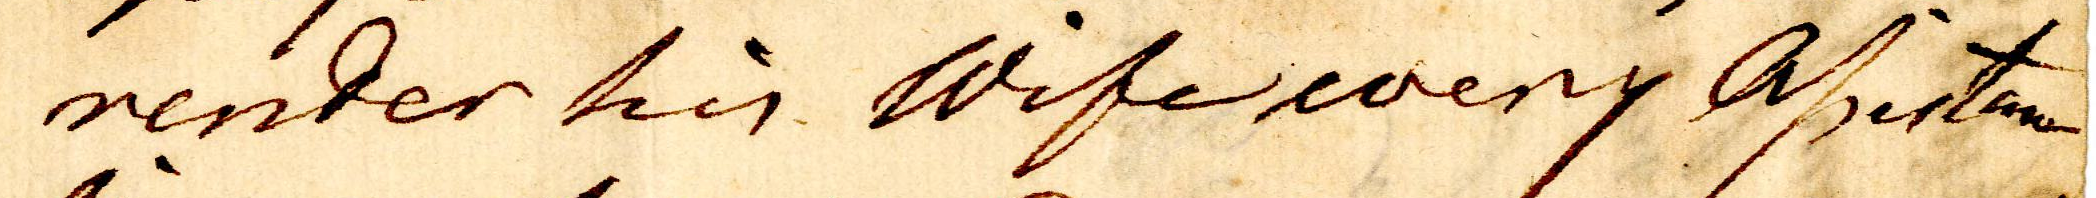render his wife every assitance
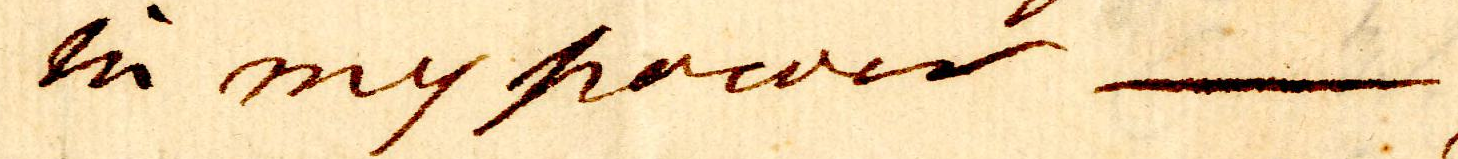in my power-
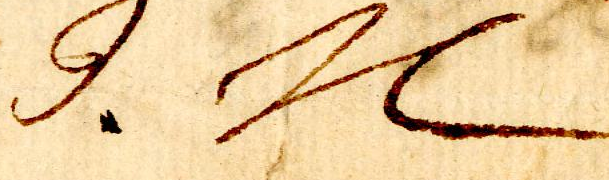J.H.
